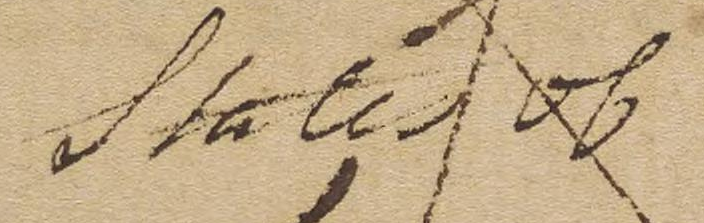State of
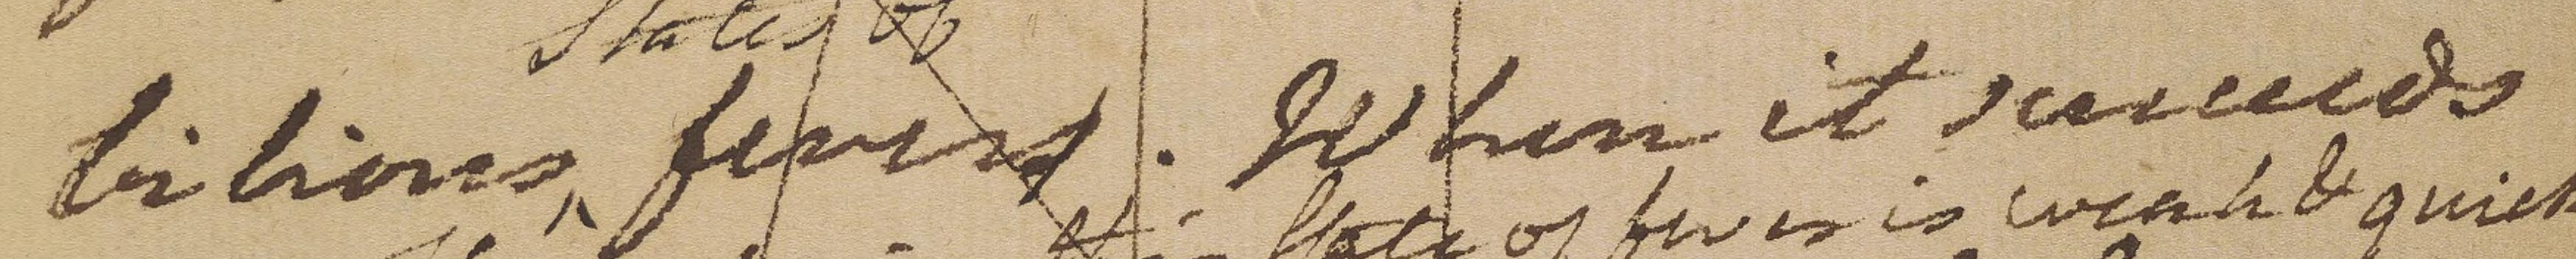bilious ^ fevers. When it succeeds
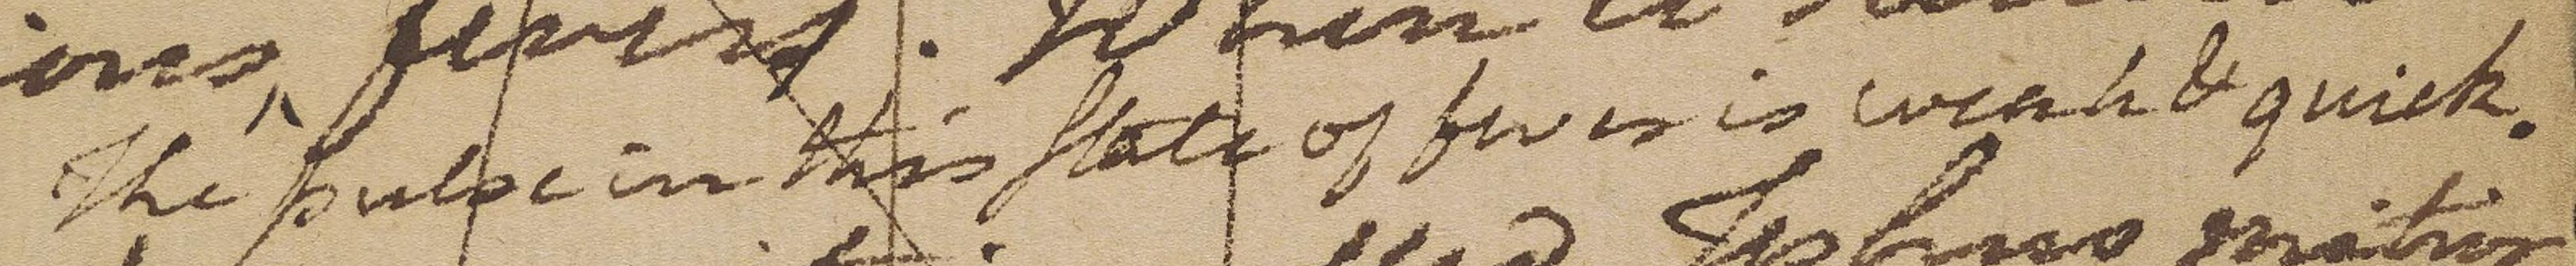The pulse in this state of fever is weak & quick.
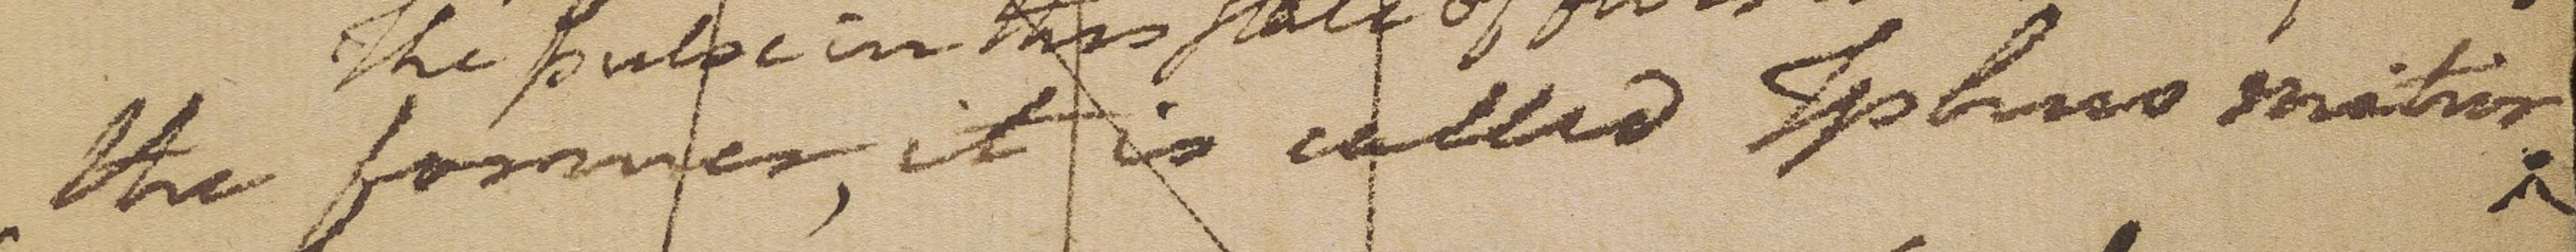the former, it is called typhus maitor.
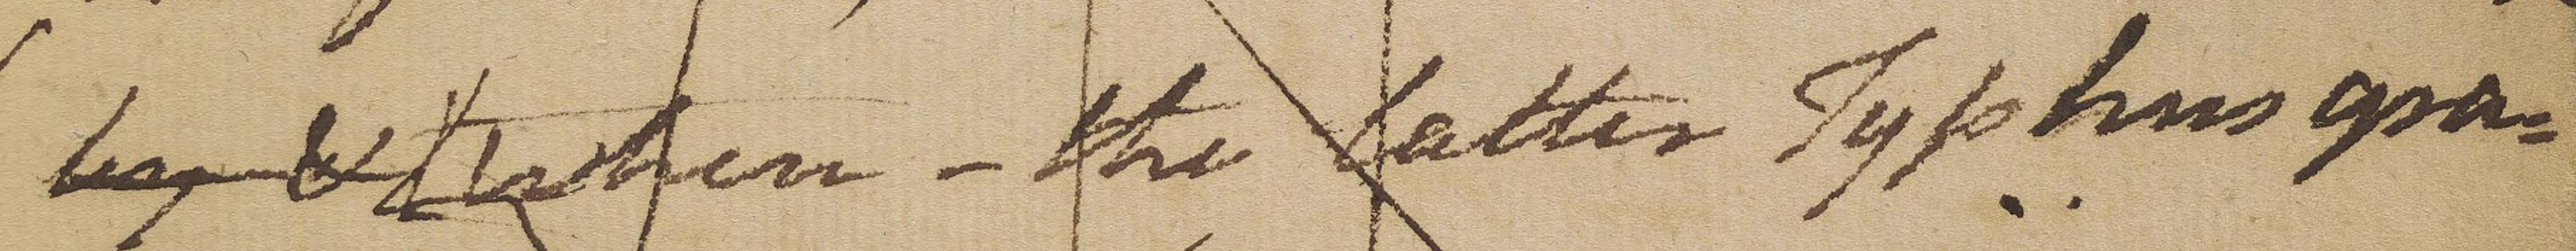V by & (When, the latter Typhus gra-
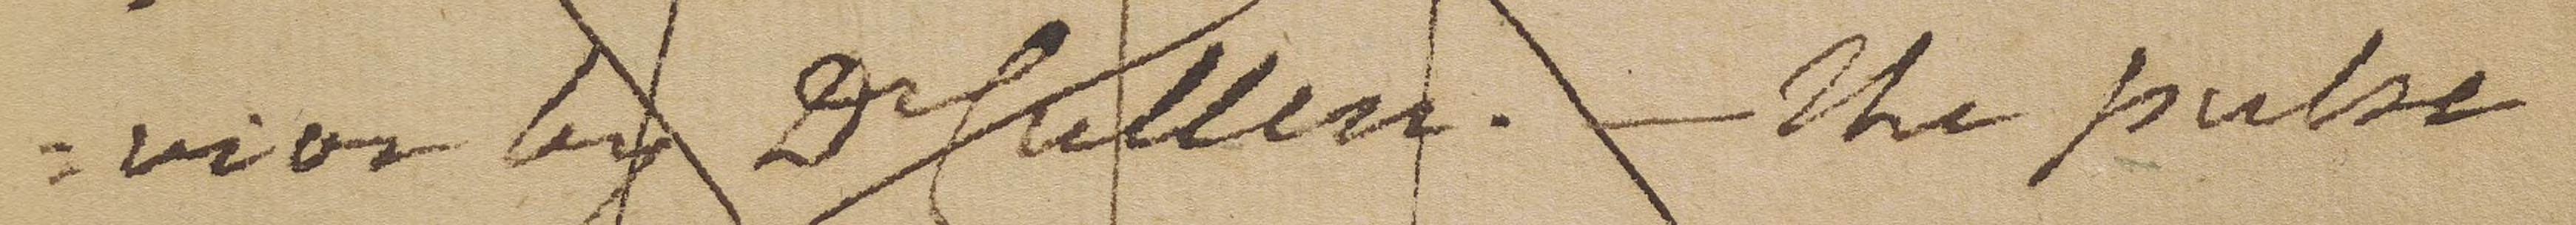-vior by D^r Cullen. The pulse
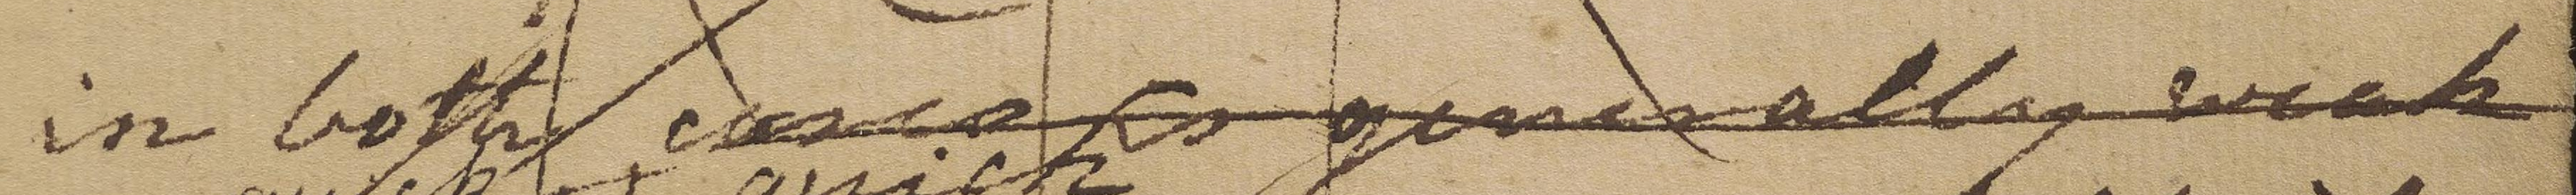in both [cases is generally weak]
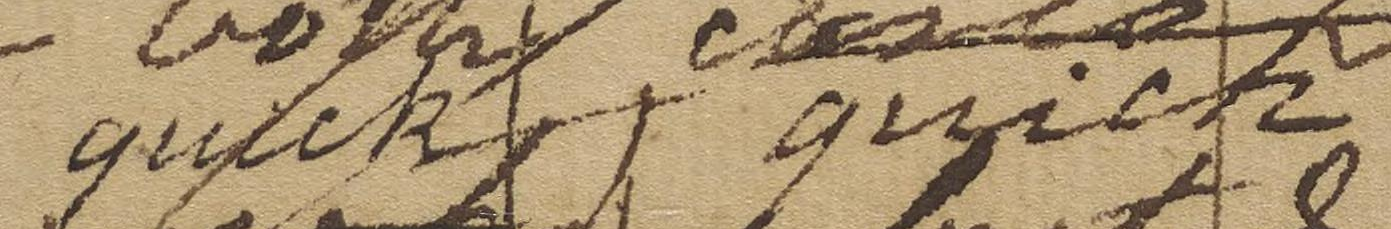quickly quick
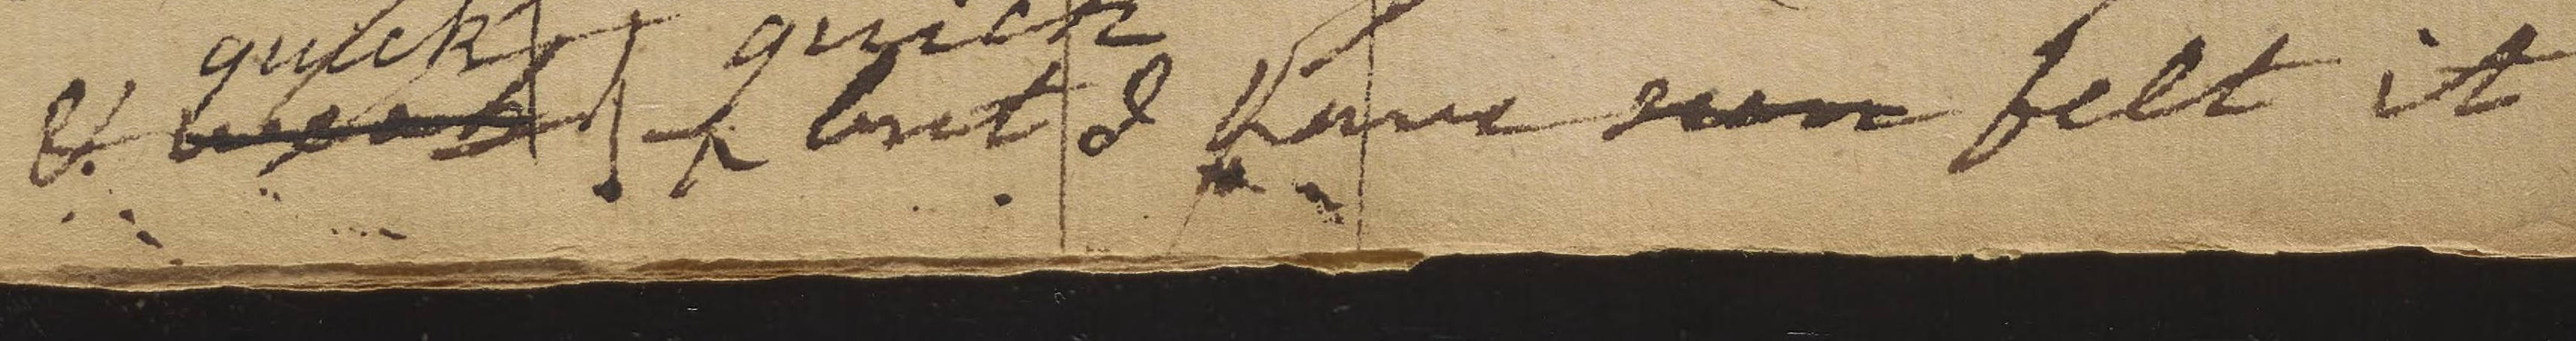& weak ^ but I have sure felt it
